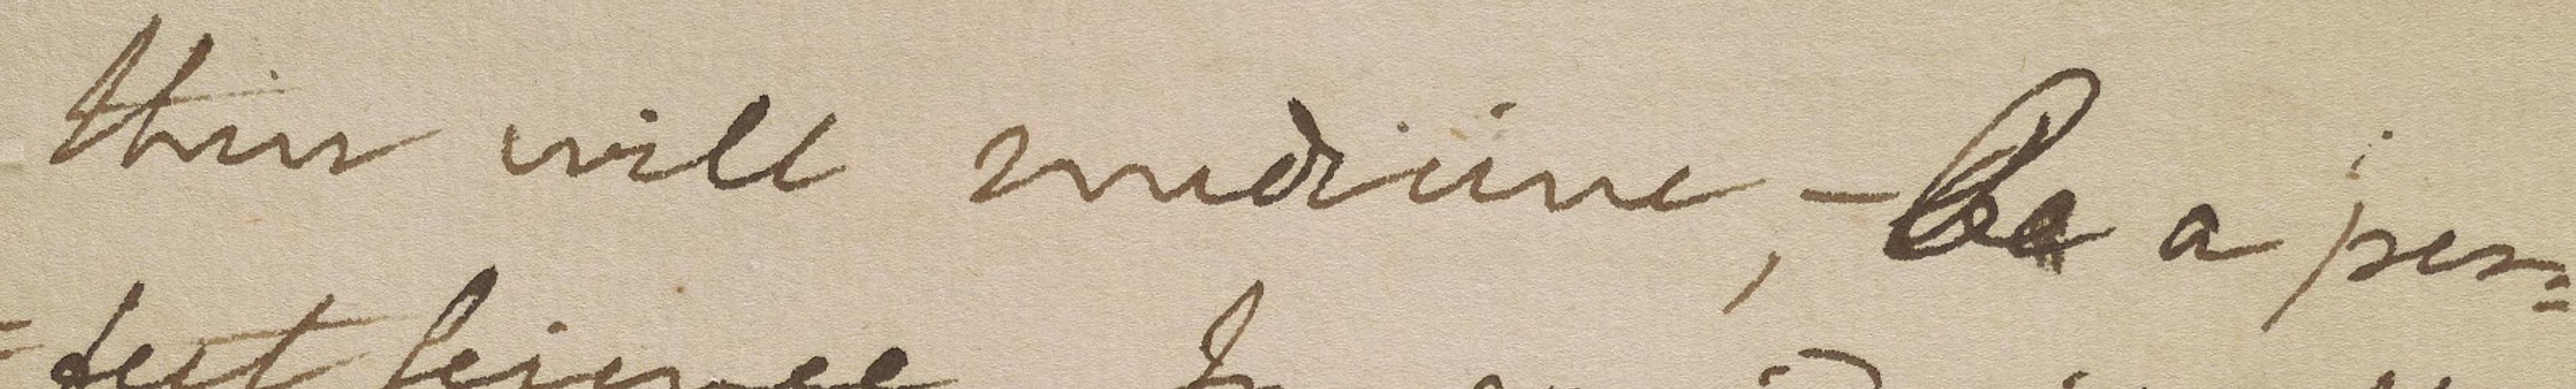this will medicine- be a per-
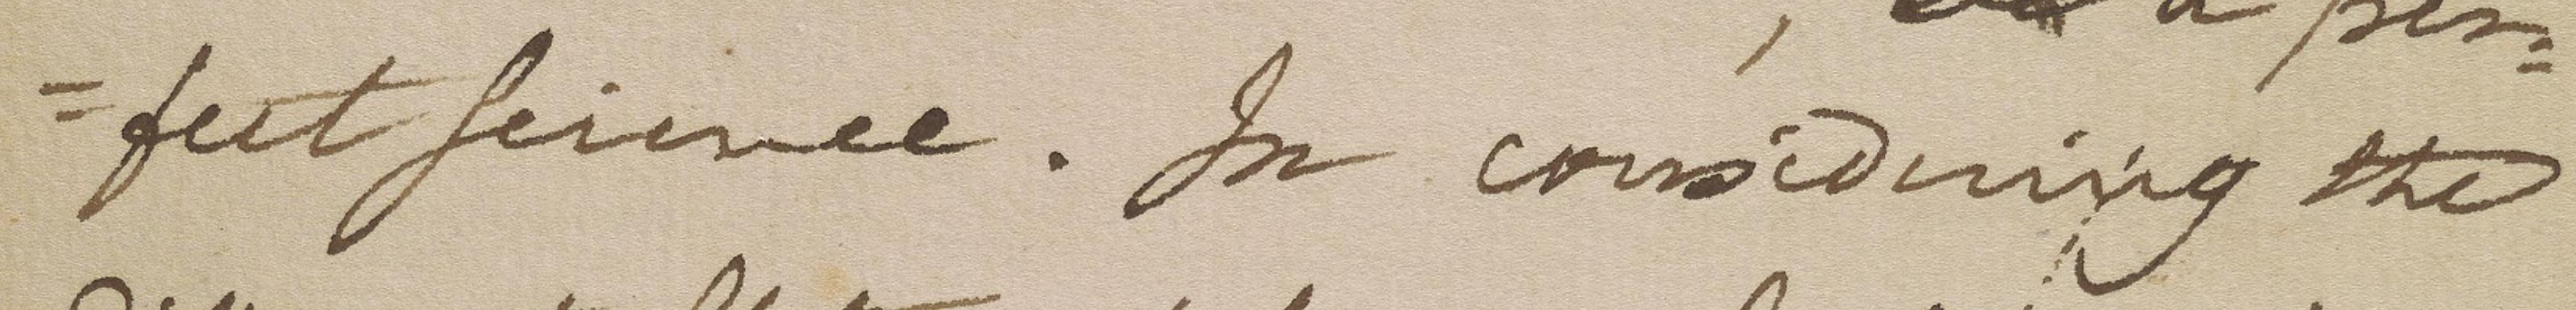-fect science. In considering the
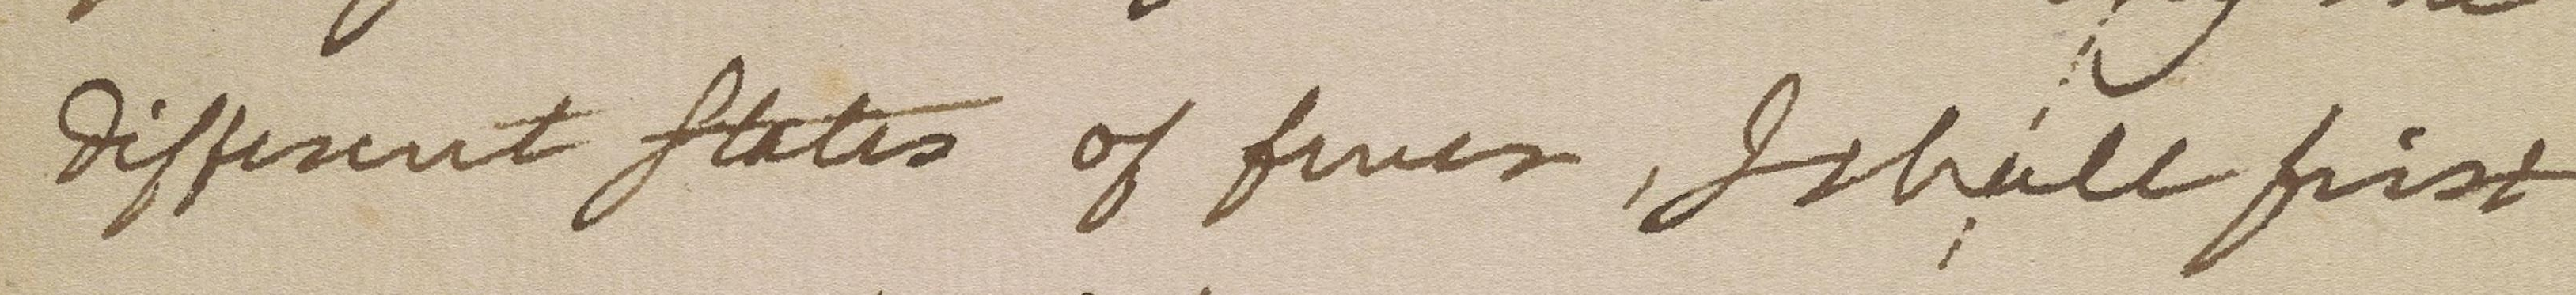different states of fever, I shall first
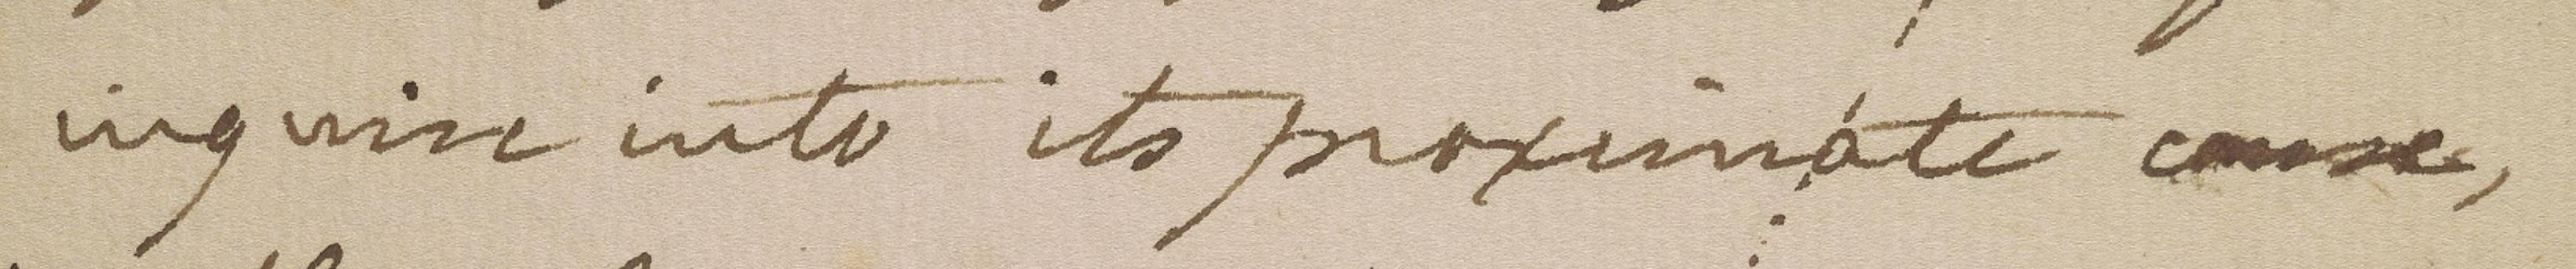inquire into its proximate cause,
